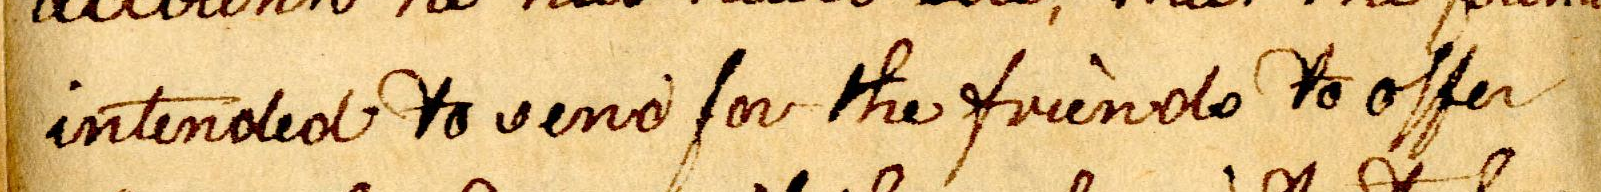intended to send for the friends to offer
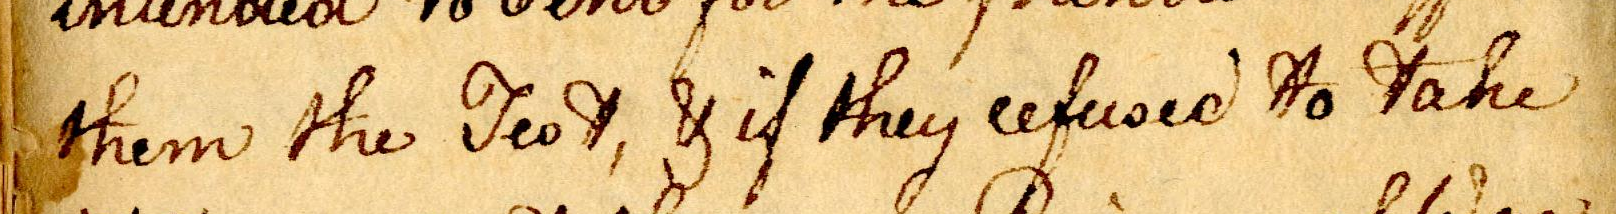them the Test, & if they refused to take
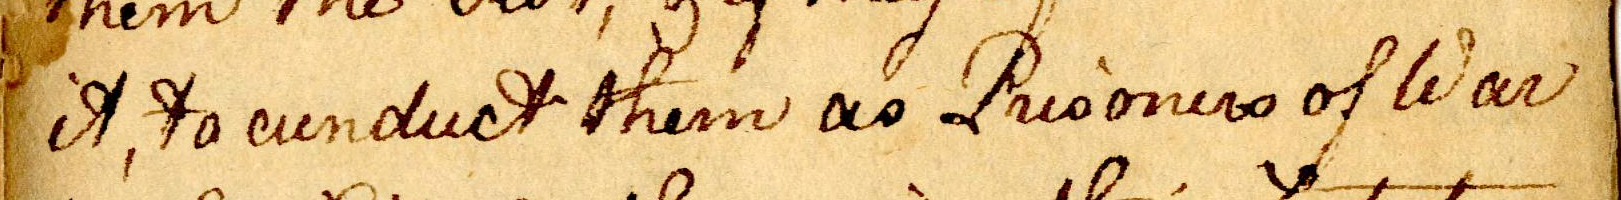it, to cunduct them as Prisoners of War
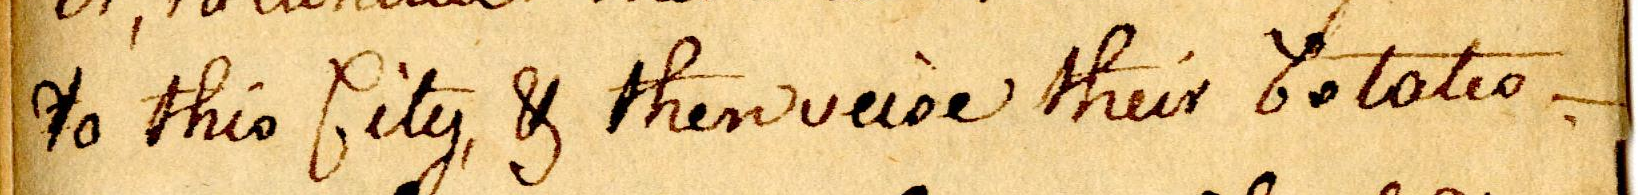to this City, & then seise their Estates-
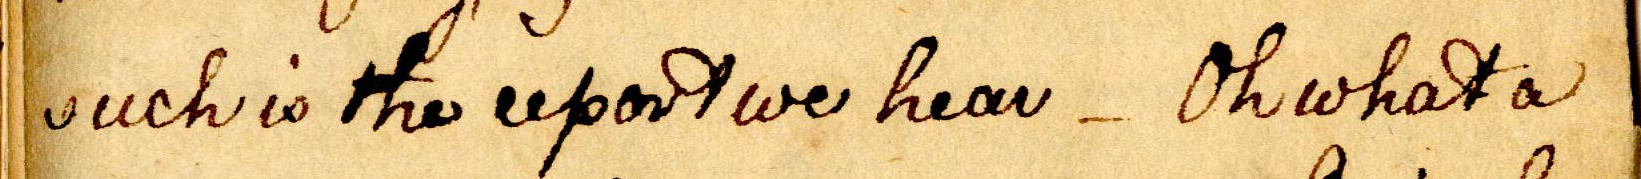such is the report we hear,- Oh what a
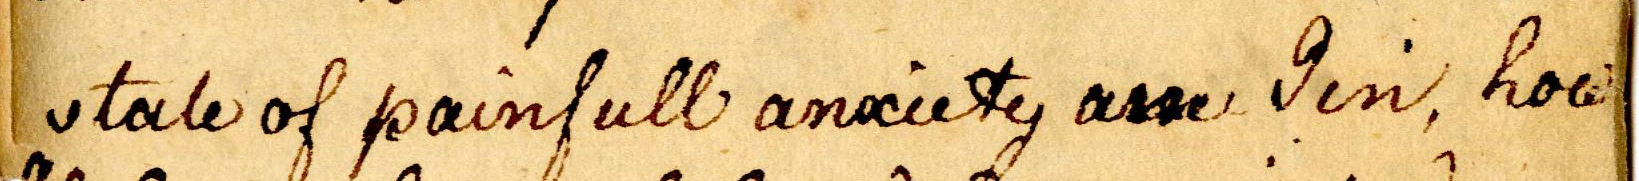state of painfull anxiety am I in, how
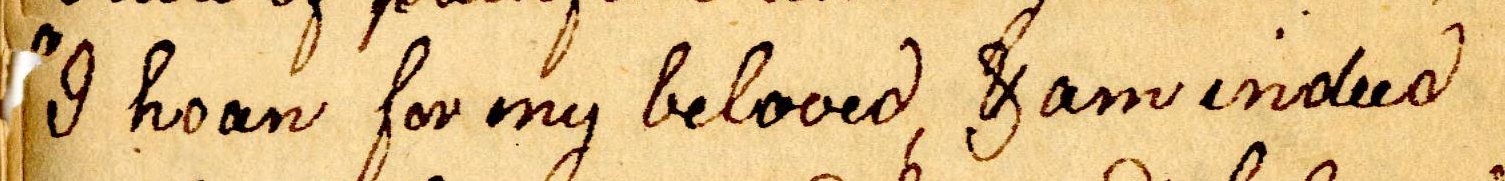I hoan for my beloved & am indeed
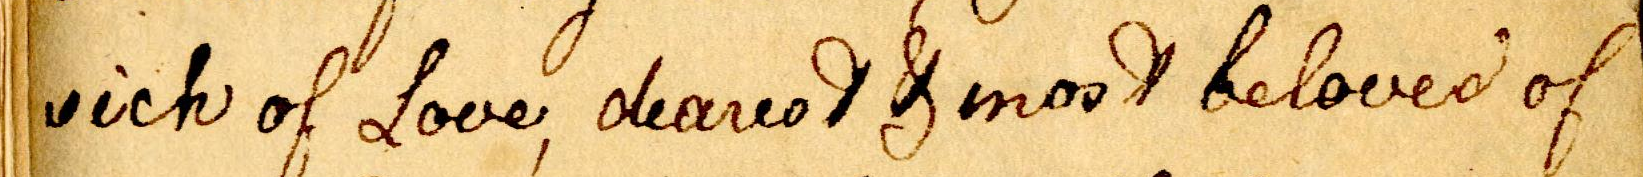sick of Love, dearest & most beloved of
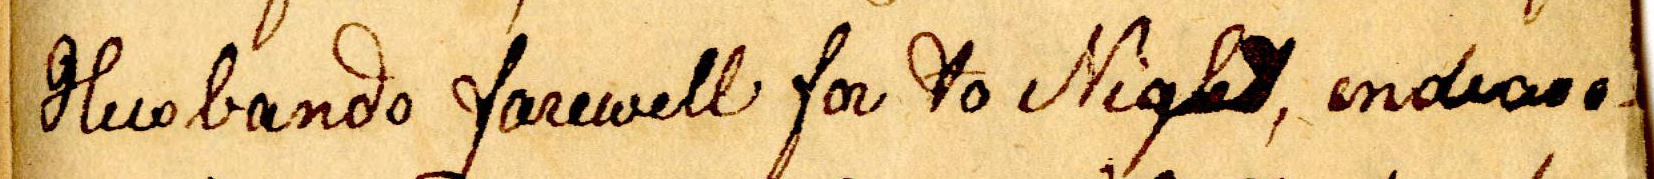Husbands farewell for to Night, endeavo
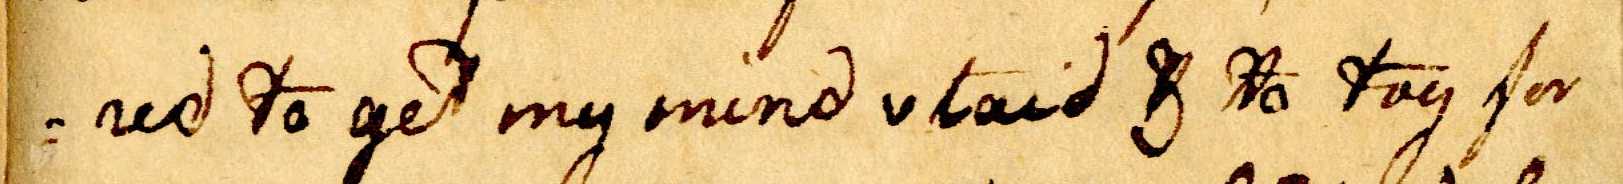-red to get my mind staid & to try for
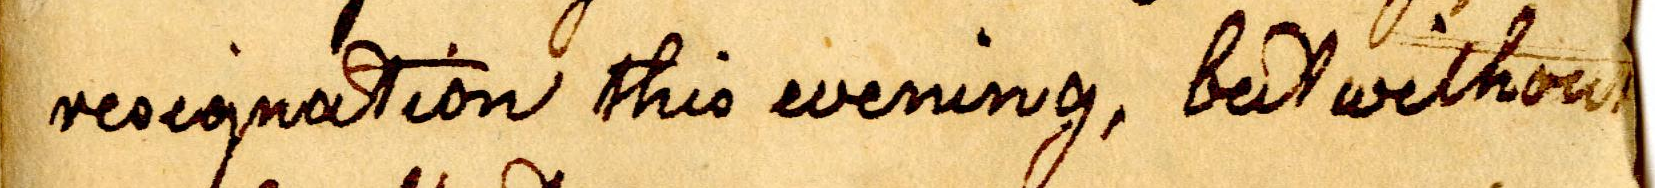resignation this evening, but without
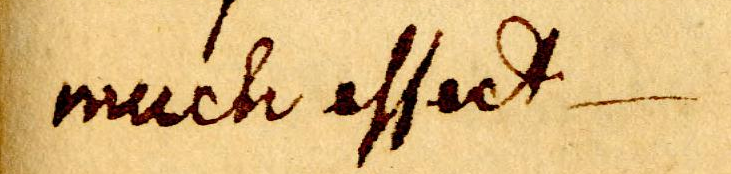much effect-
